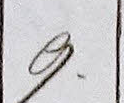9.
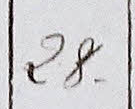28.
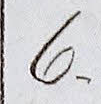6
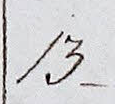13
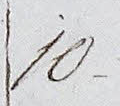10
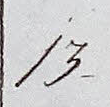13
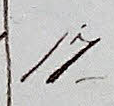17
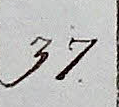37
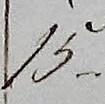15
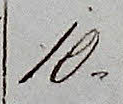10
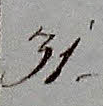31
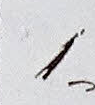1
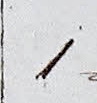1
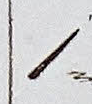1
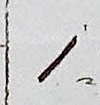1
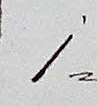1
